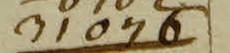31076
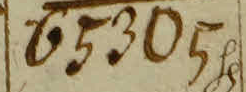65305
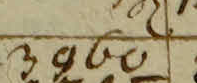3960
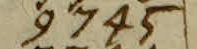9745
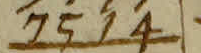7514
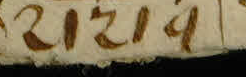21214
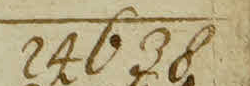24638
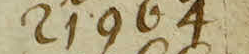21964
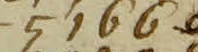5166
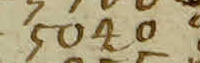5040
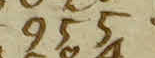955
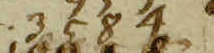3584
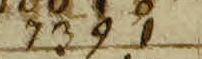7391
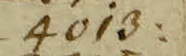4013
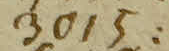3015
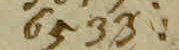6533
